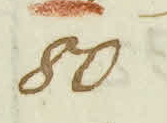80
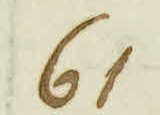61
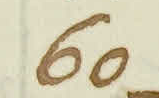60
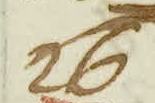26
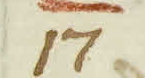17
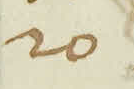20
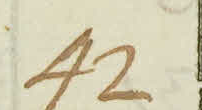42
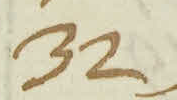32
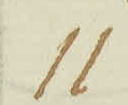11
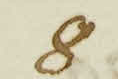8
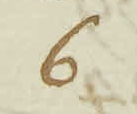6
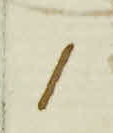1
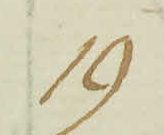19
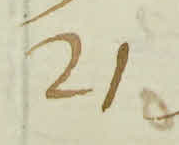21
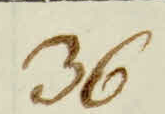36
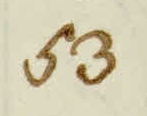53
